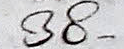38
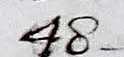48
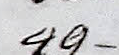49
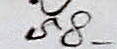58
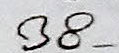38
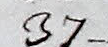37
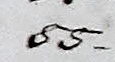55
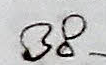38
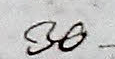30
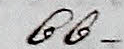66
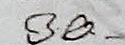30
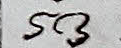53
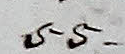55
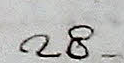28
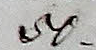50
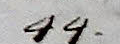44
